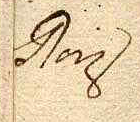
Roiz
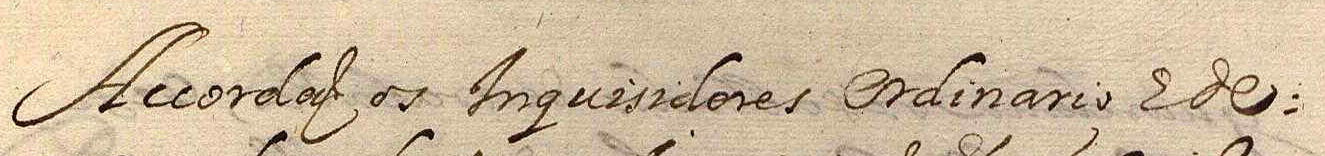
Accordaõ os Inquisidores Ordinario E de
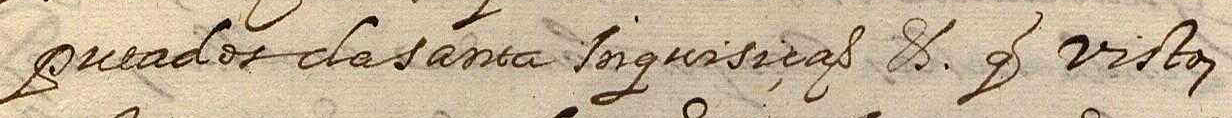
putados da santa Inquisiçaõ &. q̄ vistos
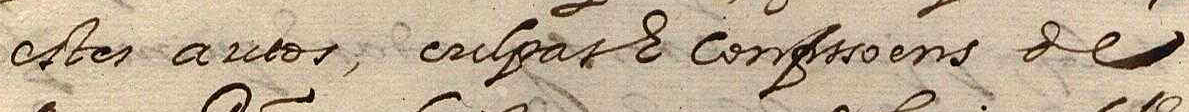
estes autos, culpas E confissoens de
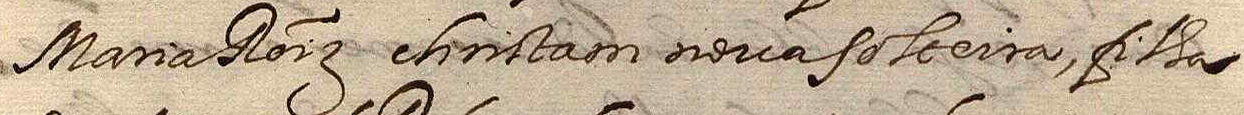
Maria Roīz christam noua solteira, filha
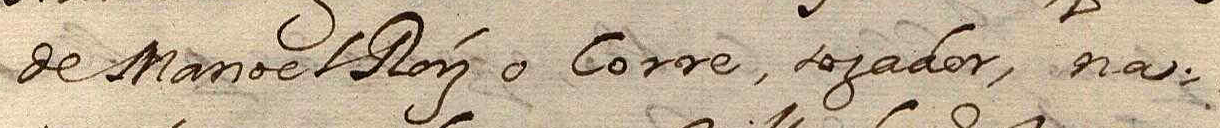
de Manoel Roíz o Corre, tozador, na
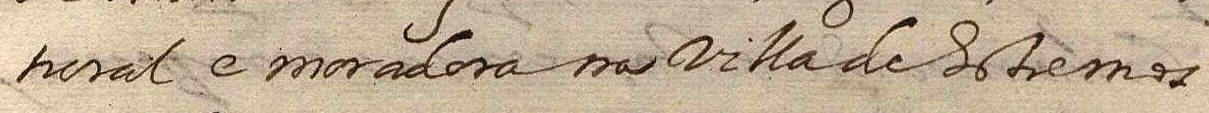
tural e moradora na villa de Estremos
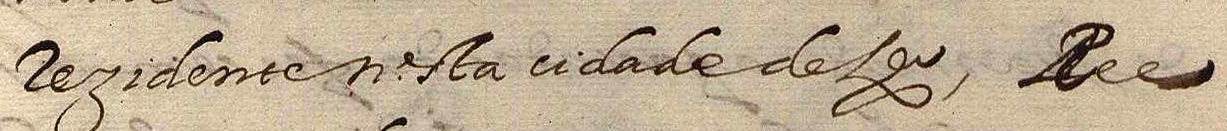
Rezidente nesta cidade de Lxa, Ree
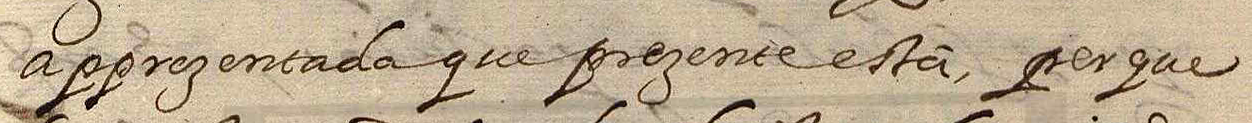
apprezentada que prezente está, per que
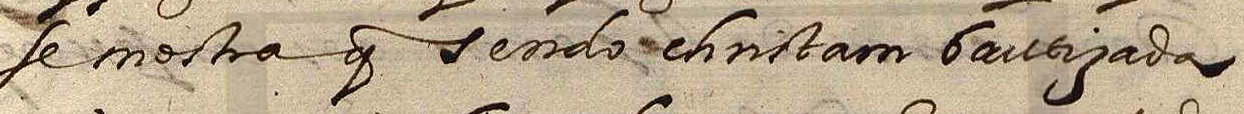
se mostra q̄ sendo christam bautizada
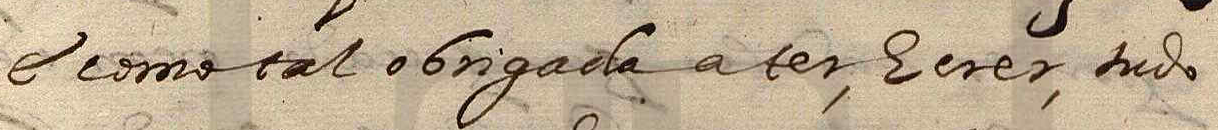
e como tal obrigada a ter, E crer, tudo
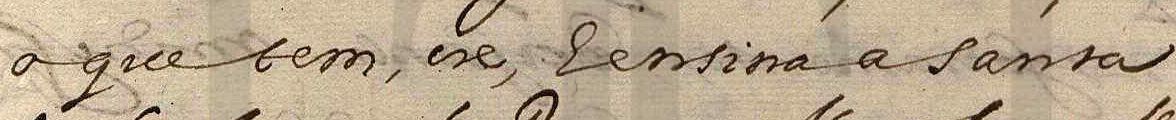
o que tem, cre, E ensina a santa
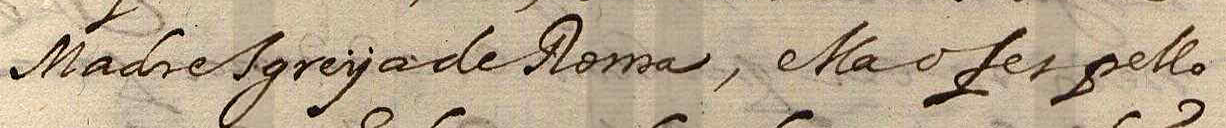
Madre Igreya de Roma, ella o fes pello
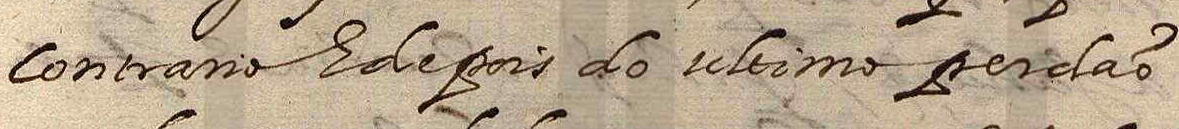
contrario E depois do ultimo perdaõ
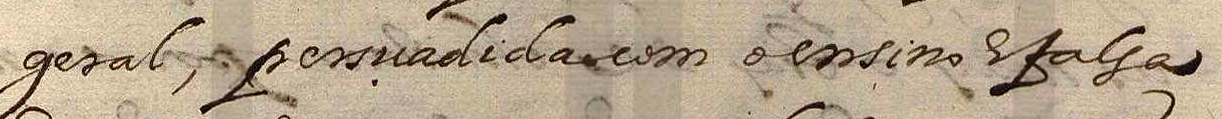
geral, persuadida com o ensino E falsa
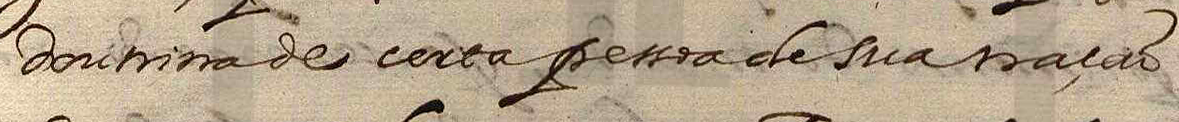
doutrina de certa pessoa de sua naçaõ
